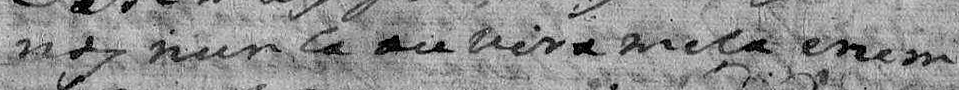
nos nunca ouvira meça e nem
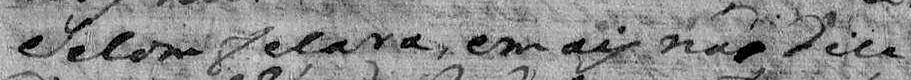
Se comfeçara, e mais naõ dice
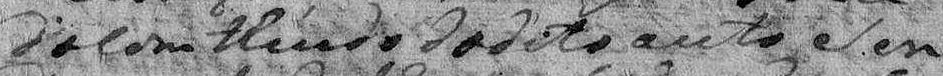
do comtheudo do dito auto Sen
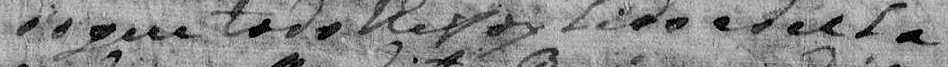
do que todo lhe foy lido e decla
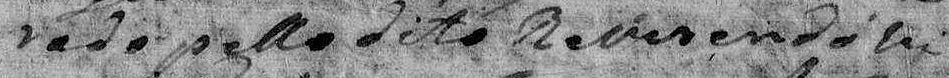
rado pello dito Reverendo vi
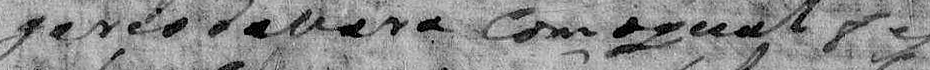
gario da vara com o qual fes
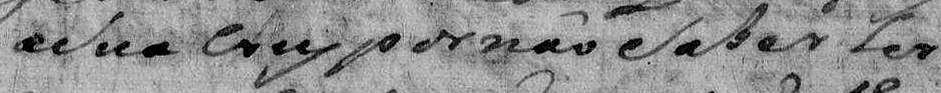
a sua crus por não saber Ler
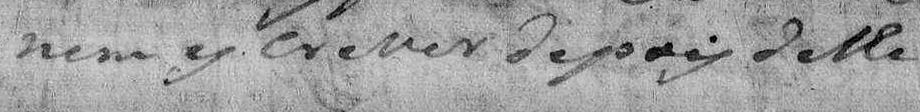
nem escrever depois delle
